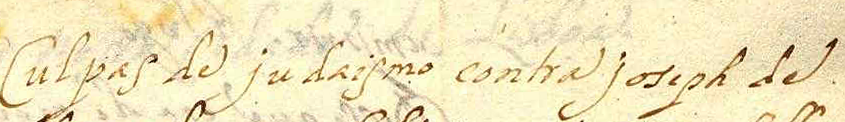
Culpas de judaismo contra joseph de
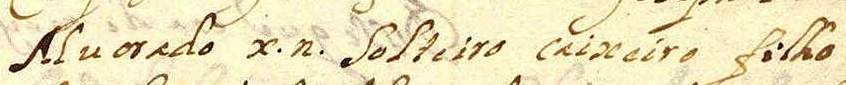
Aluorado x. n. Solteiro caixeiro filho
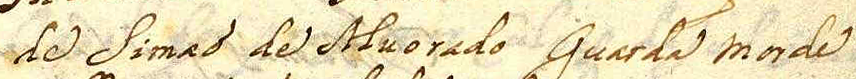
de Simaõ de Aluorado Guarda mor de
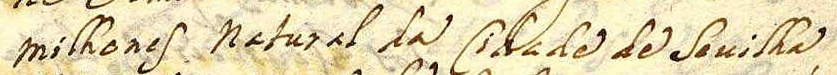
milhones natural da Cidade de Seuilha,
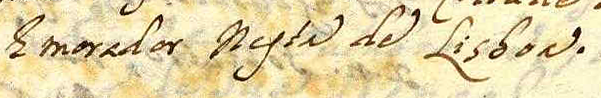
E morador nesta de Lisboa.
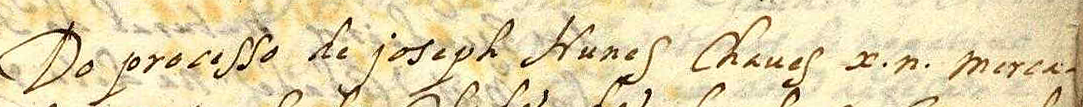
Do processo de joseph Nunes Chaues x. n. merca
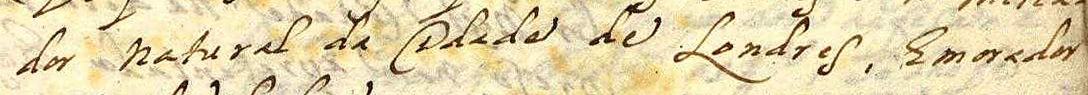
dor natural da Cidade de Londres, E morador
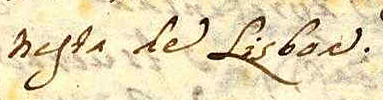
nesta de Lisboa.
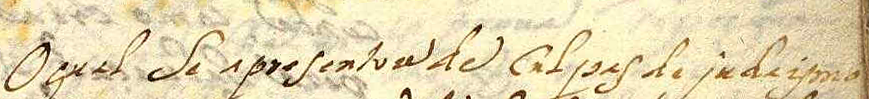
O qual Se apresentou de Culpas de judaismo
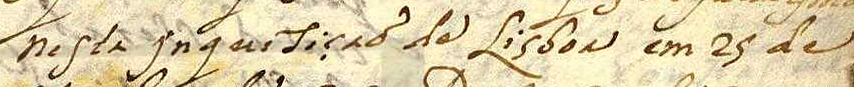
nesta jnquisiçaõ de Lisboa em 25 de
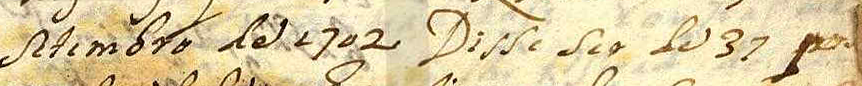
Setembro de 1702 Disse ser de 37 pa.
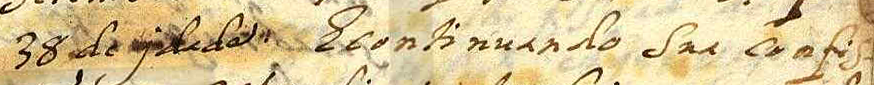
38 de jdade. E continuando sua confis
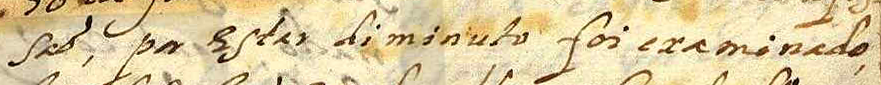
saõ, por Estar diminuto foi examinado,
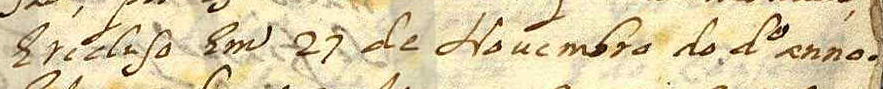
E recluso Em 27 de Nouembro do do anno.
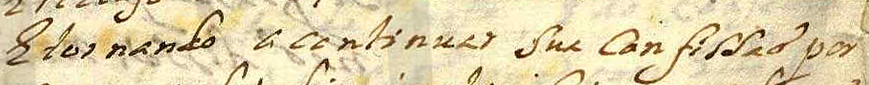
E tornando a continuar sua confissaõ por
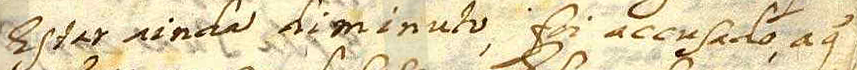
Estar ainda diminuto, foi accusado, a q̄
